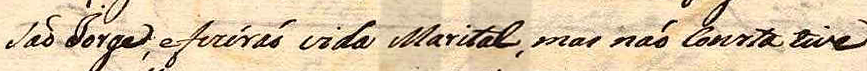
São Iorge, e fizéraõ vida marital, mas naõ consta tive
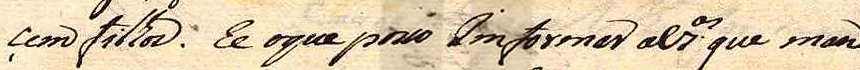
çem filhos. he o que posso informar a v s.as que man
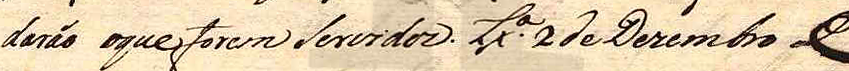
darão o que forem servidoz. Lx.a 2 de Dezembro d̄
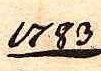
1783
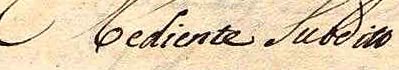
Obediente Subdito
